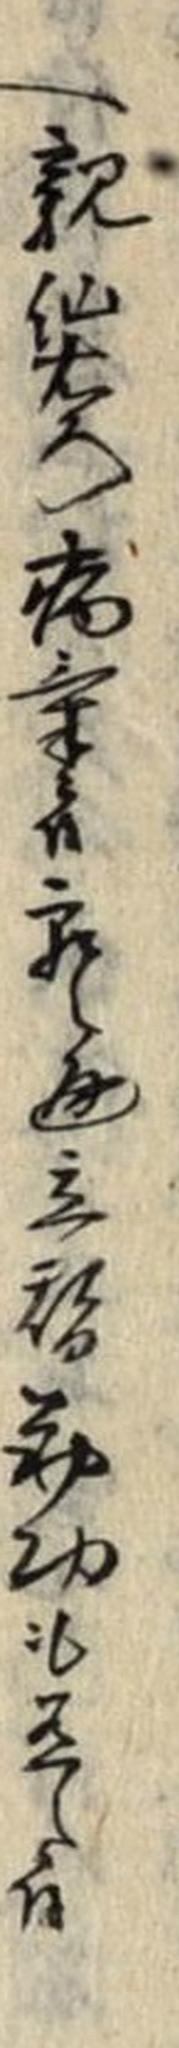親仙右衛門病気に付願之通立替勤功も有之候に付
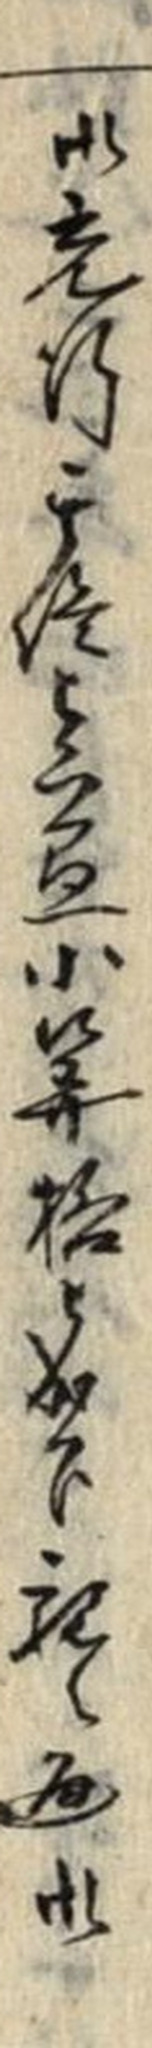御充行其侭被下置小算格被成下親之通御
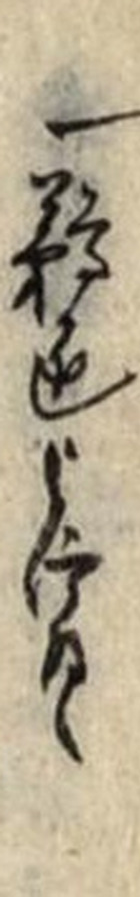鵜匠被仰付候
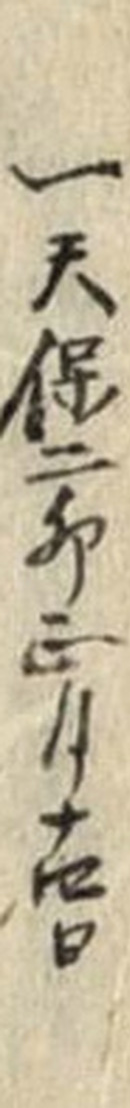一天保二卯正月十四日
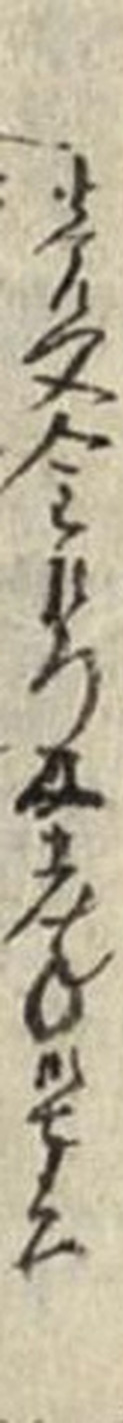養父金左衛門及老年御奉公一統格
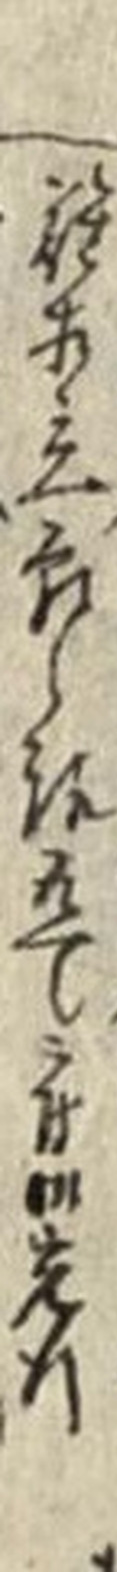難相立願之趣有之候付御充行鵜匠
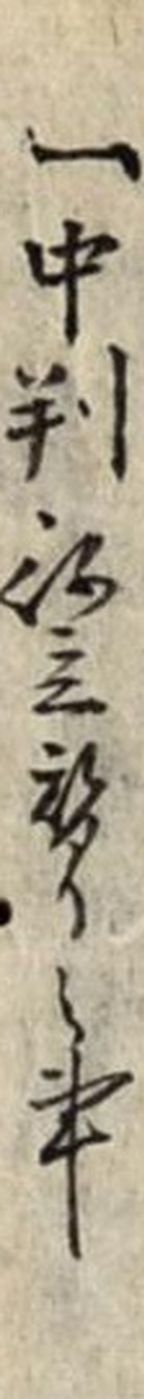一中判役立替り之事
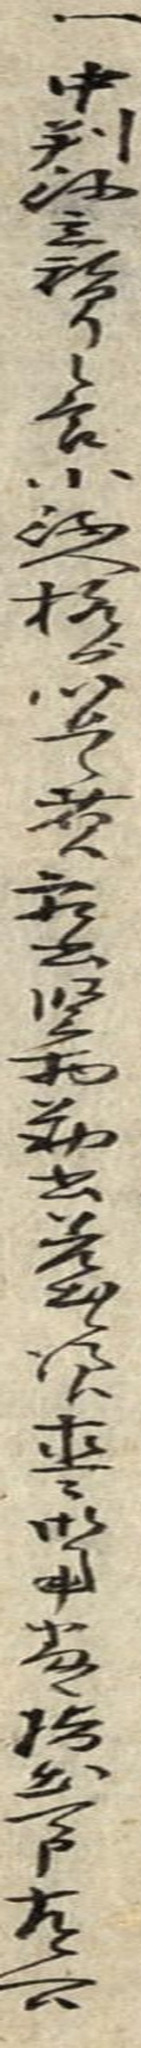一中判役立替り之節小役人格ゟ以上之者は願書竪物勤書差出候得は直に御用番へ指出可申左候へは
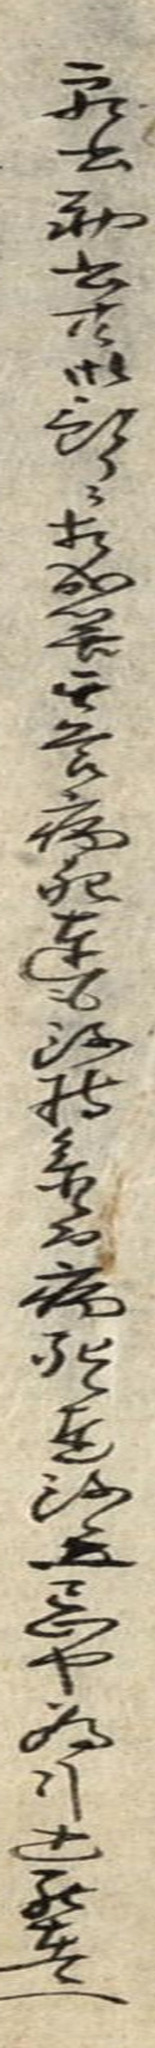願書勤書共御預りに相成筈其節病死達も致持参候而病死候達致候上忌中為引込罷在候へ
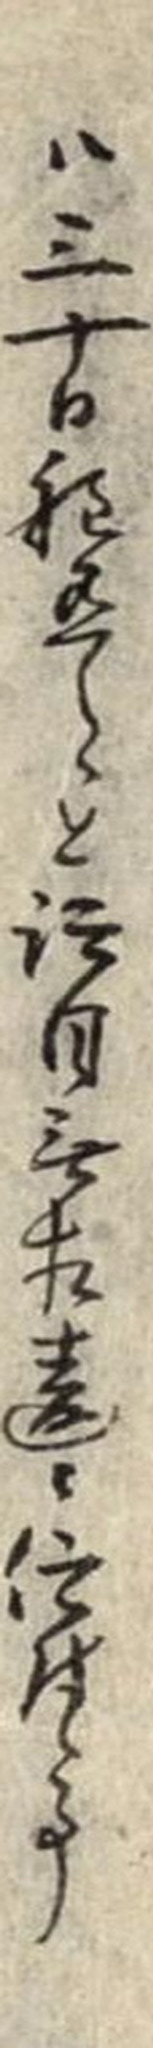は三十日程有之候と跡目無相違被仰付候事
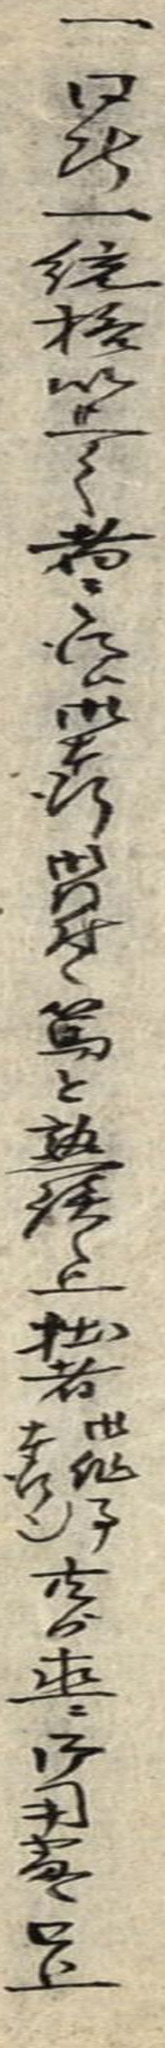一同断一統格以上之者に候得は御奉行御目付へ篤と熟談之上拙者御作事奉行也共ゟ直に御用番へ口上
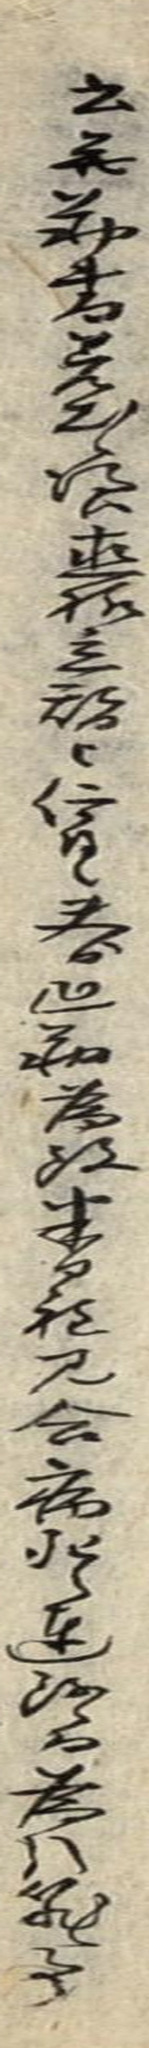書并勤書差出候得は直様立替被仰付候夫ゟ廻勤為致半日程見合病死之達致候而為引籠候事
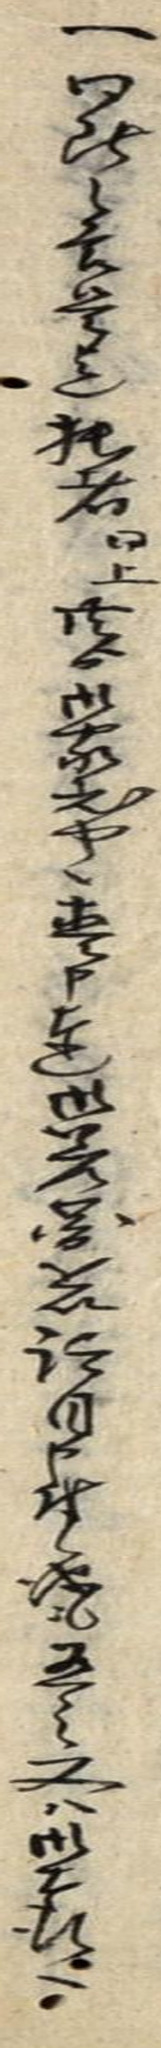一同断之節是迄拙者同上共ゟ御家老中へ直々申達御差図を以跡目申付候儀も有之又は御奉行へ

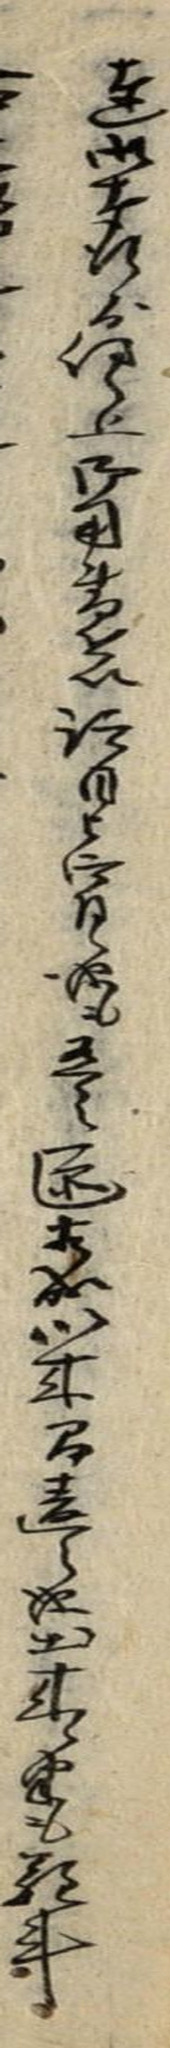達御奉行ゟ伺之上御用書を以跡目被仰付候儀も有之区相成以来間違之儀出来候半も難斗
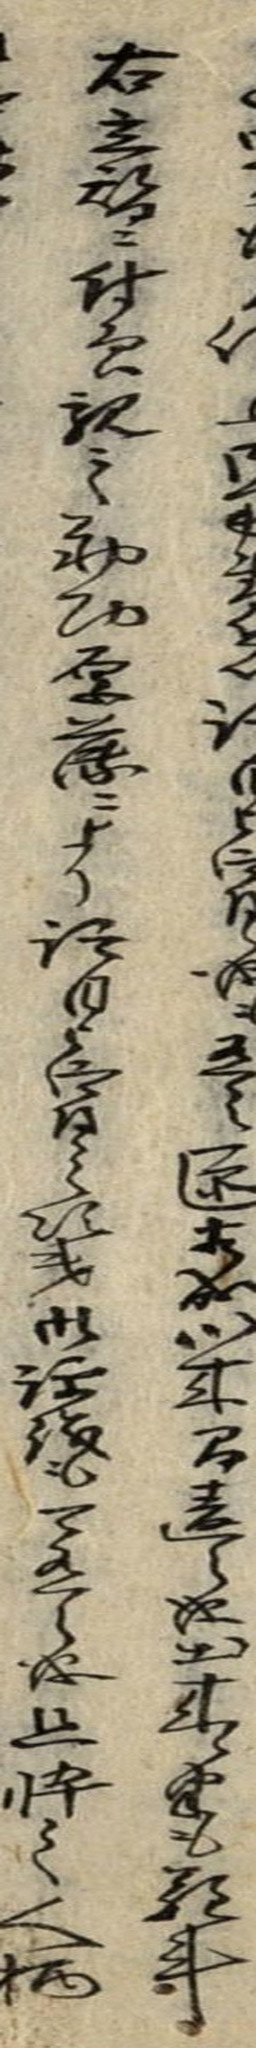右立替に付而は親之勤功厚廉により跡目被仰付候次第御評議も可有之候儀且忰之人柄
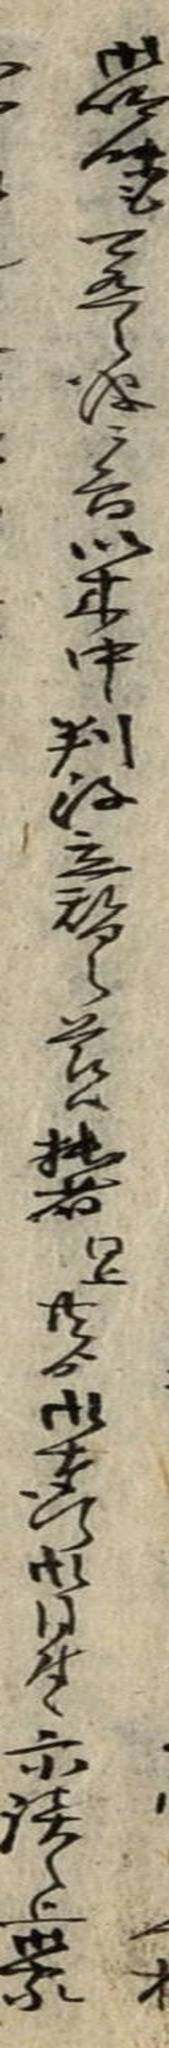御吟味も可有之儀に候間以来中判役立替之節は拙者同上共ゟ御奉行御目付へ示談之上御家
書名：御用并被仰出之部
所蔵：福井県文書館 Fukui Prefectural Archives
